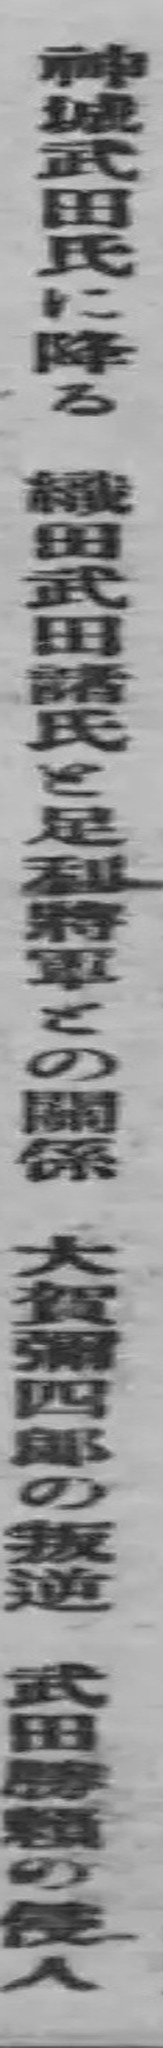神城武田氏に降る織田武田諸氏と足利将軍との関係大賀弥四郎の叛逆武田勝頼の侵入
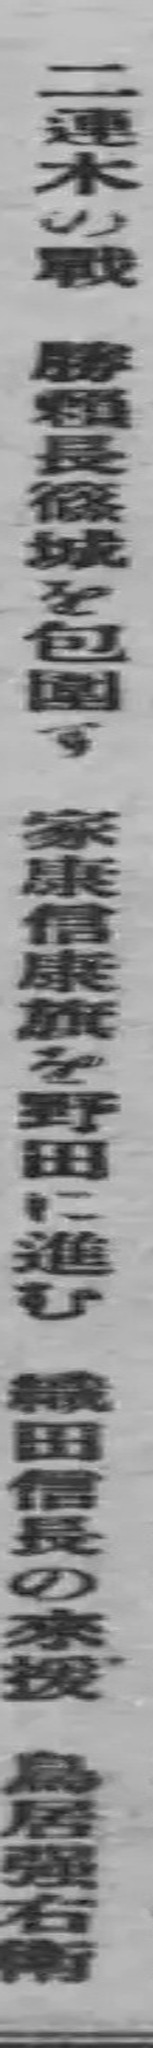二連木の戦勝頼長篠城を包囲す家康信康旗を野田に進む織田信長の来援鳥居弥右衛
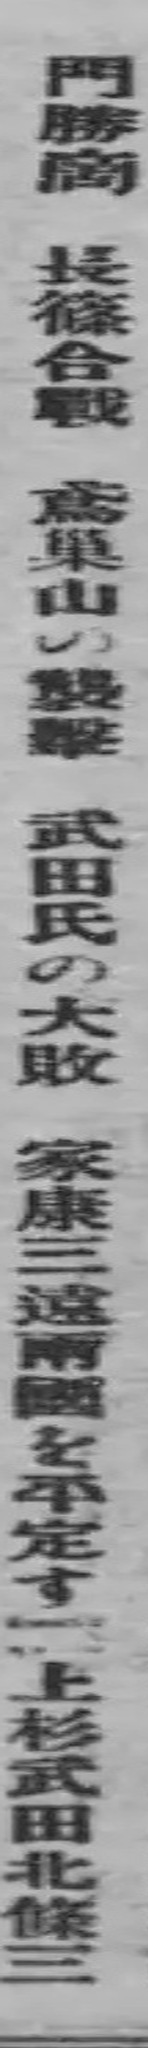門勝啇長篠合戦鳶巣山の襲撃武田氏の大敗家康三遠両国を平定す上杉武田北条三
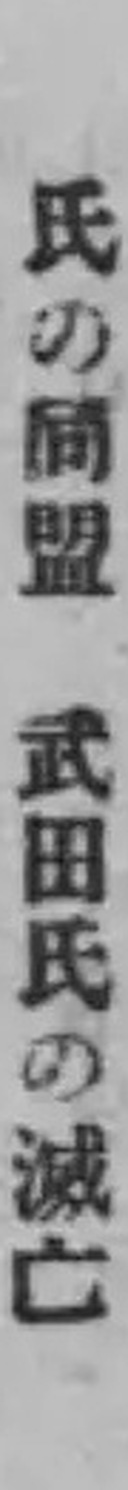氏の同盟武田氏の滅亡
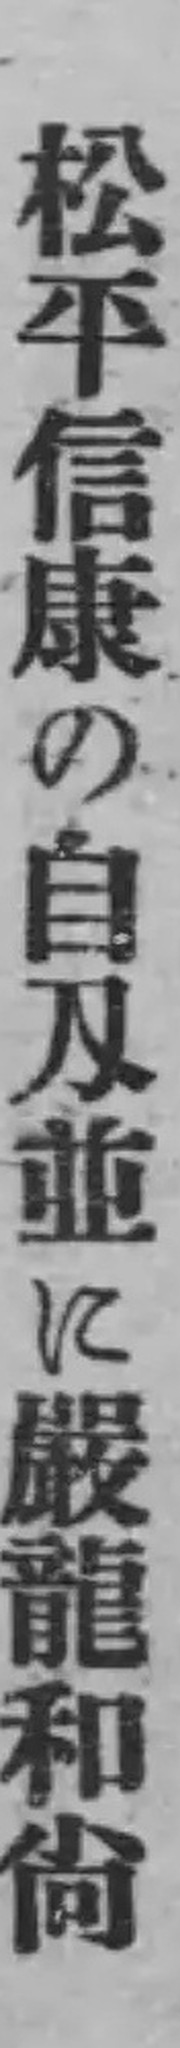松平信康の自刃並に厳龍和尚
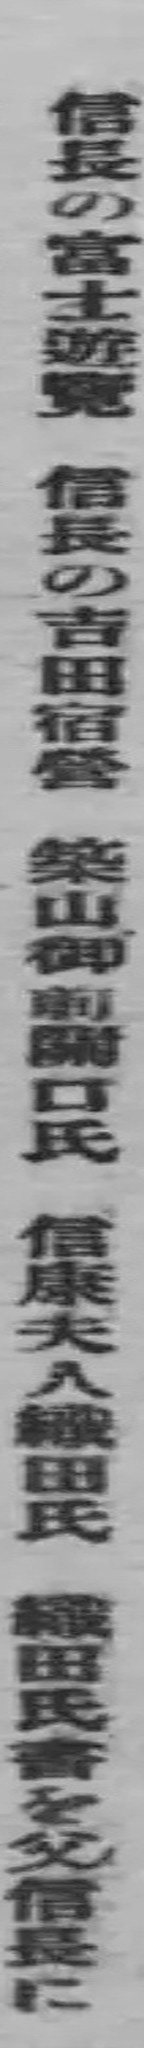信長の富士遊覧信長の吉田宿営築山殿前関口氏信康夫人織田氏織田氏書を父信長に
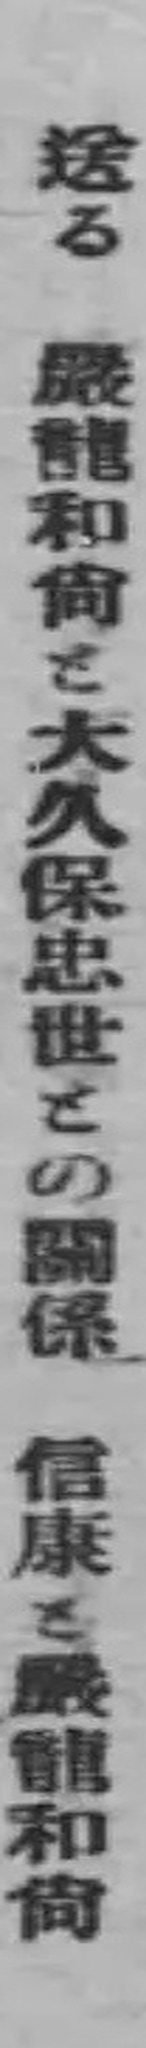送る厳龍和尚と大久保忠世との関係信康と厳龍和尚
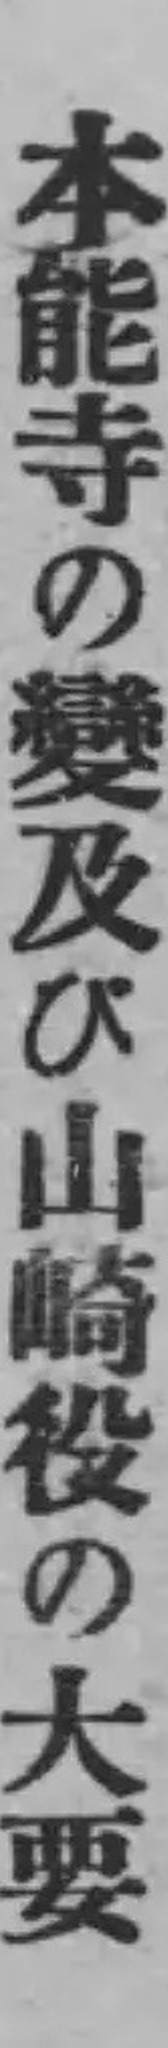本能寺の変及び山崎役の大要
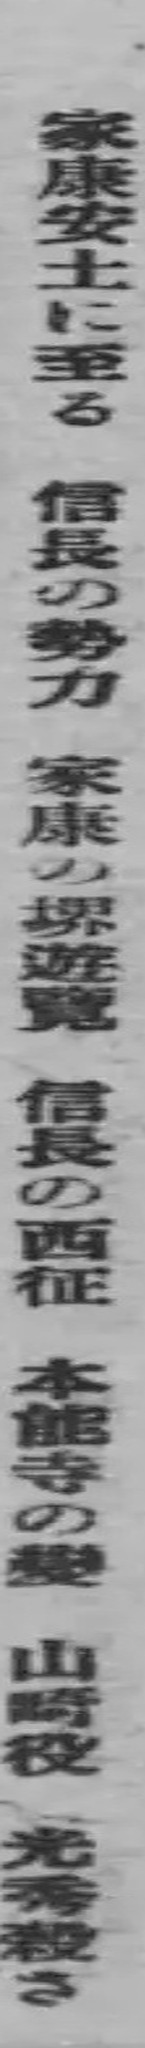家康安土に至る信長の勢力家康の堺遊覧信長の西征本能寺の変山崎役光秀殺さ
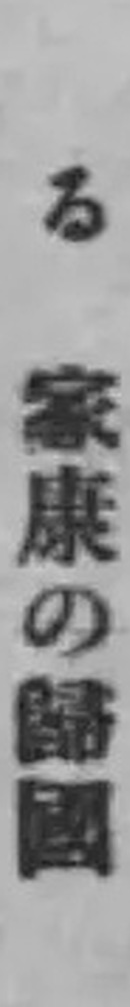る家康の帰国
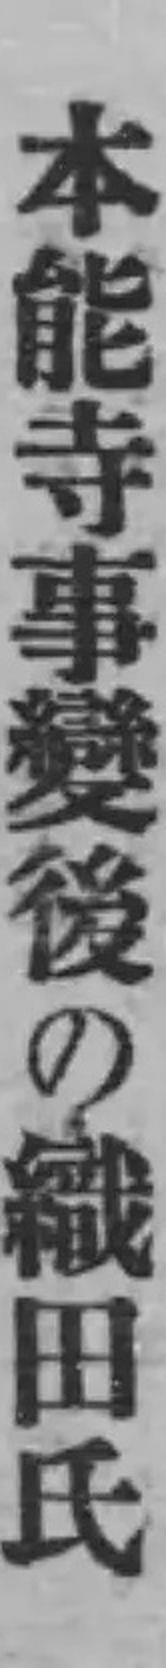本能寺事変後の織田氏
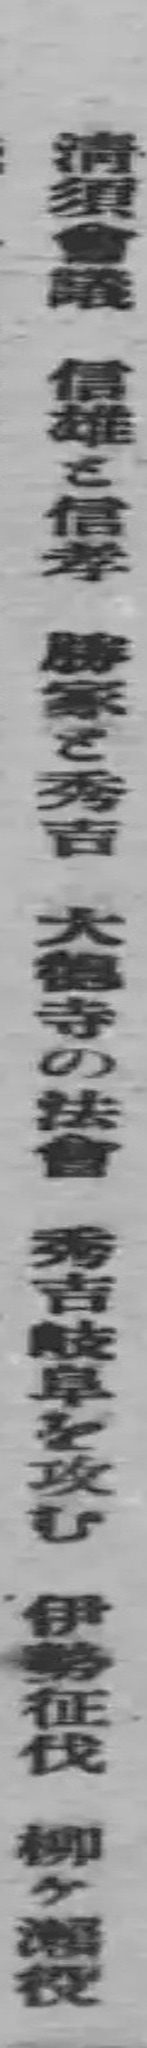清洲会議信勝と信孝勝家と秀吉大徳寺の法会秀吉岐阜を攻む伊勢征伐柳ケ瀬役
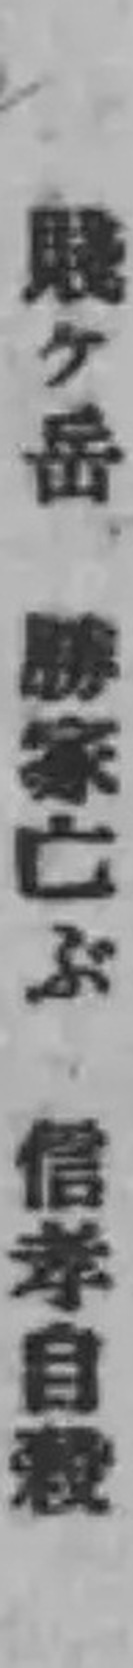賤ケ岳勝家亡ぶ信孝自殺
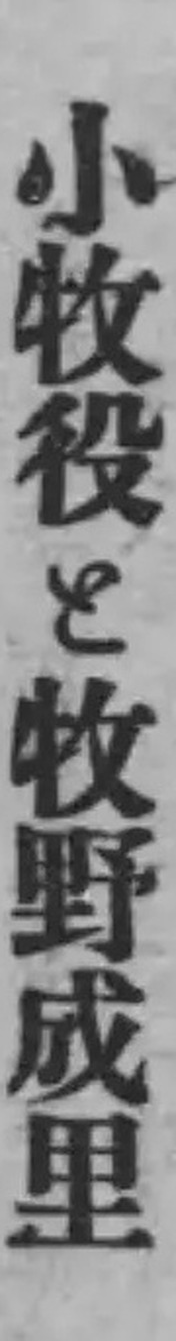小牧役と牧野成里
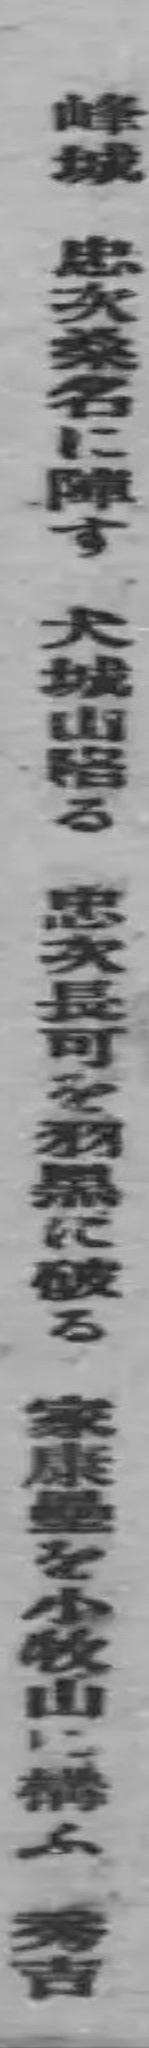峰城忠次桑名に陣す犬城山陥る忠次長可を羽黒に破る家康塁を小牧山に構ふ秀吉
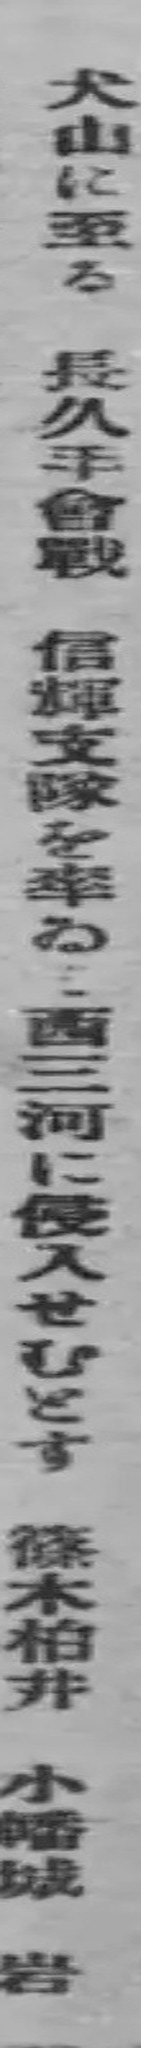犬山に至る長久手合戦信輝支援を率ゐて西三河に侵入せむとす篠木柏井木幡城岩
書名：豊橋市史談
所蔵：国立国会図書館 National Diet Library, JAPAN
